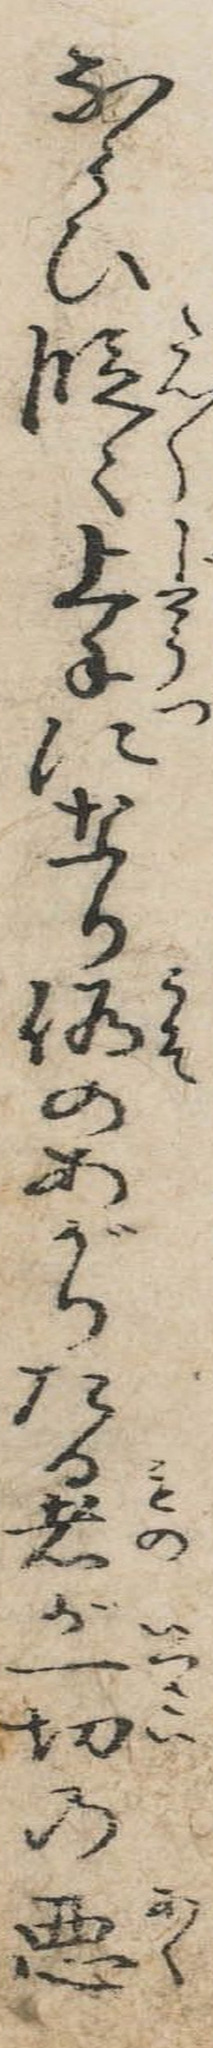ならひ段々上手になり偽のあがりたる者が一切の悪

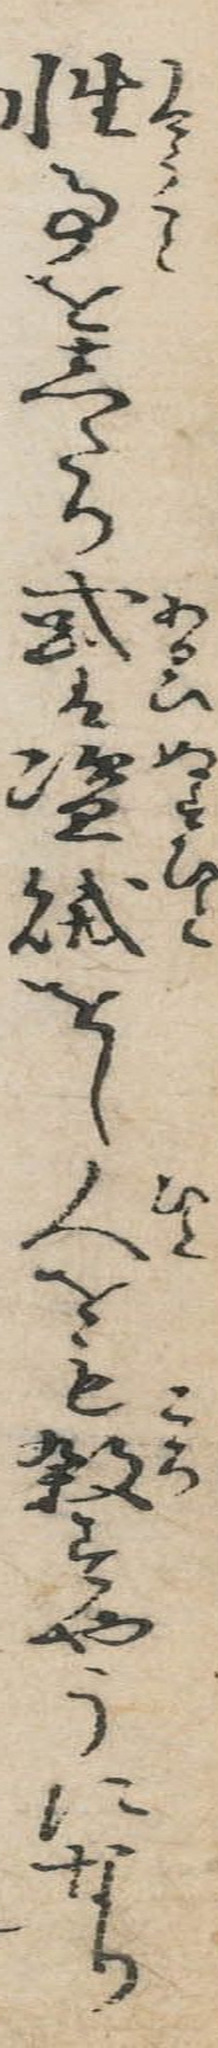性事をしたり或は盗賊をし人をも殺すやうになり
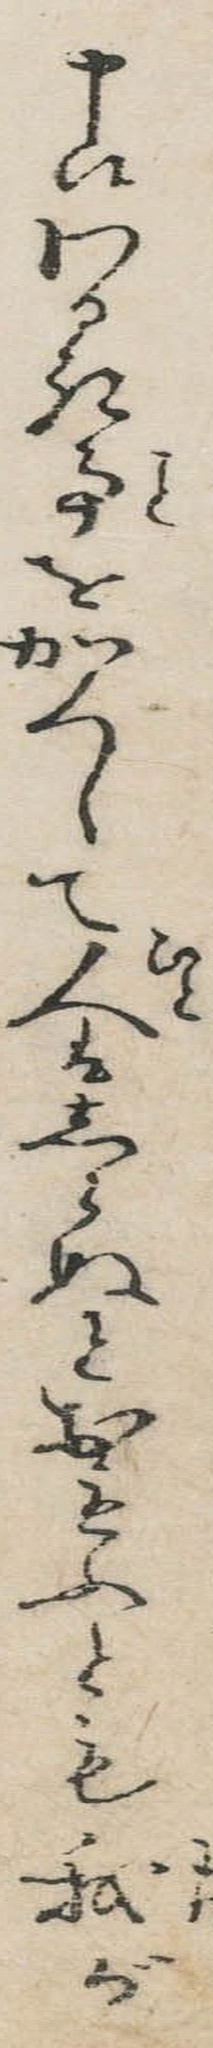申候わるき事をかくして人はしらぬとおもふとも我が
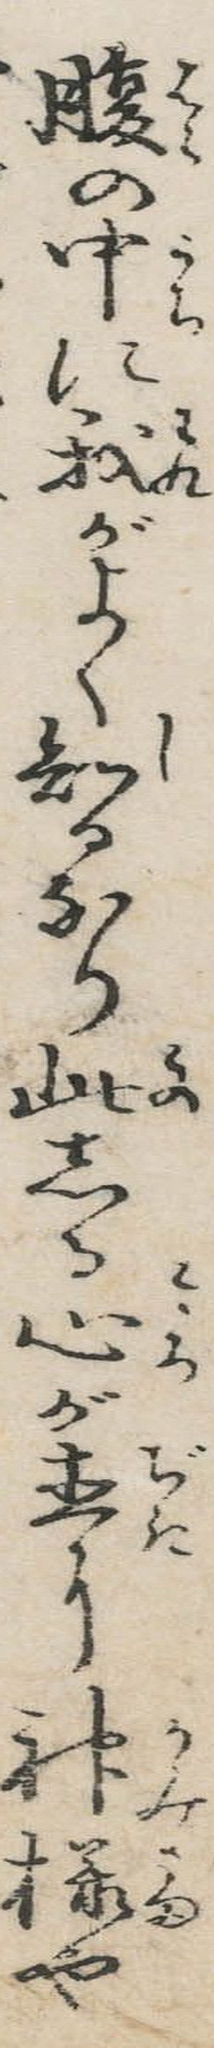腹の中に我がよく知るなり此しる心が直に神様や
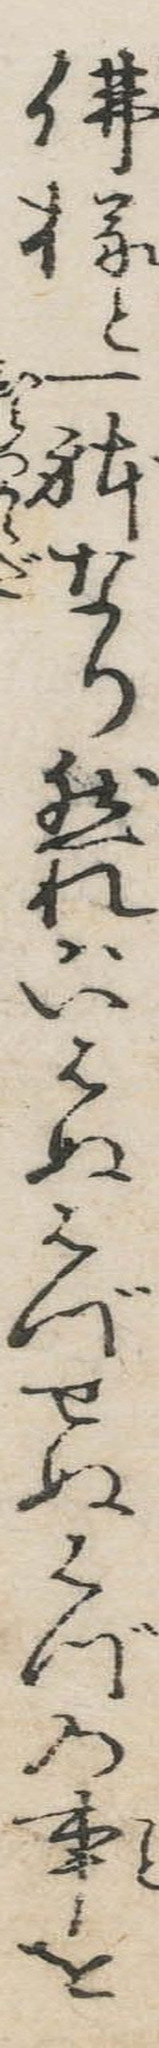仏様と一躰なり然れはいはぬはづせぬはづの事を
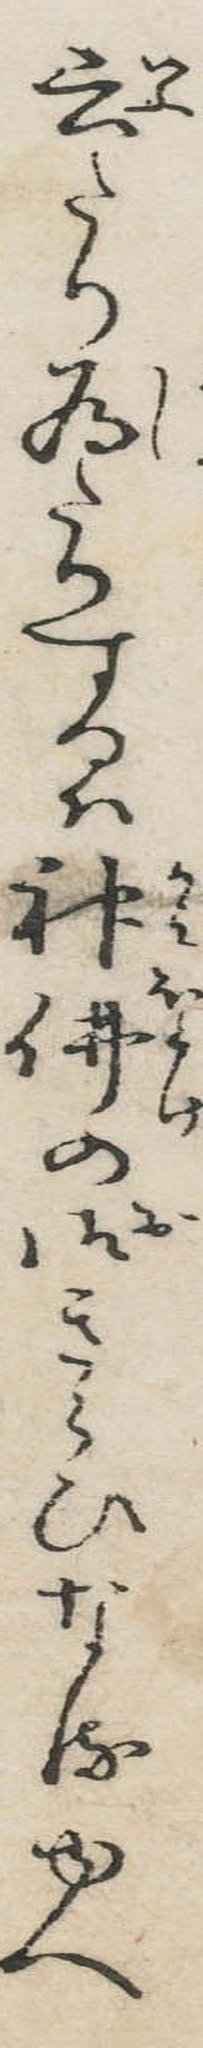云たり為たりするは神仏の御きらひなるゆへ
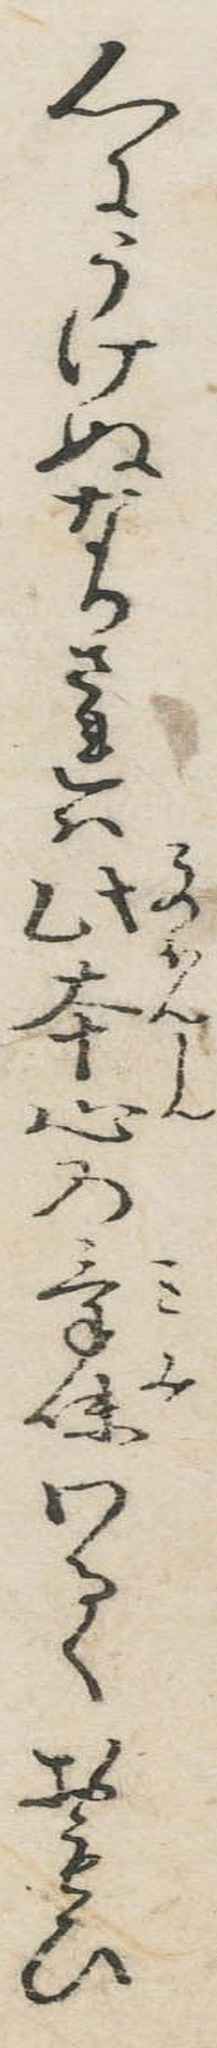心にうけぬなりされは此本心の気味わるくおもひ
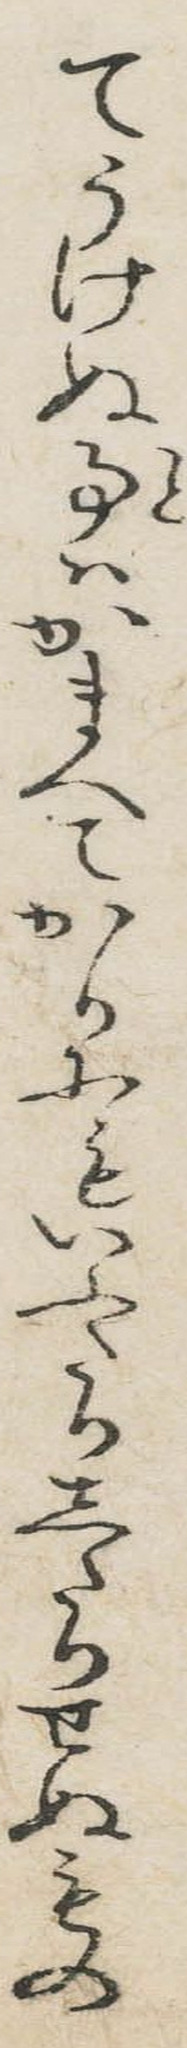てうけぬ事はかまへてかりにもいふたりしたせぬもの
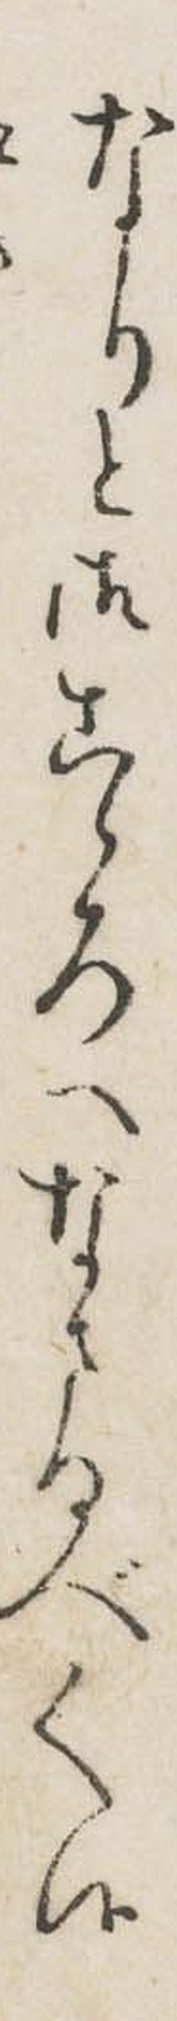なりと御こゝろへなさるべく候
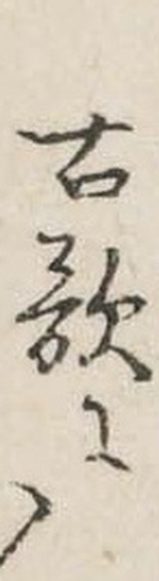古歌に
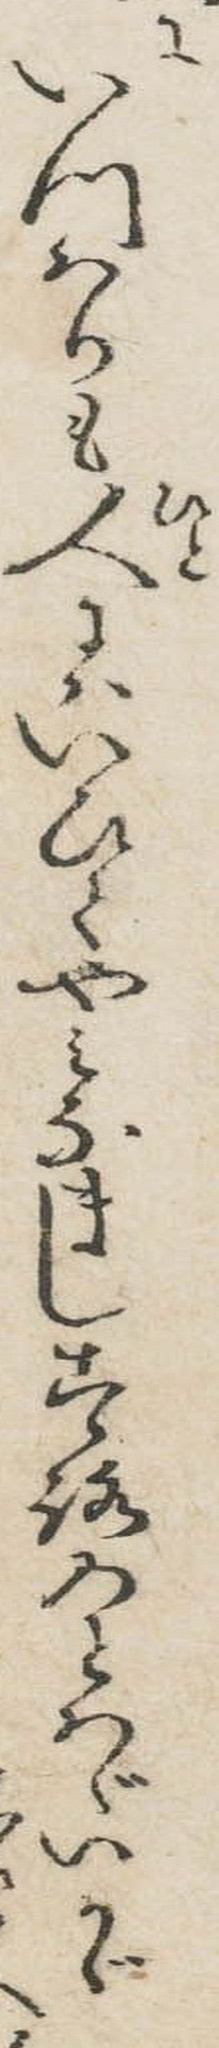いつわりも人にはいひてやみなましこゝろのとはゞいかゞ
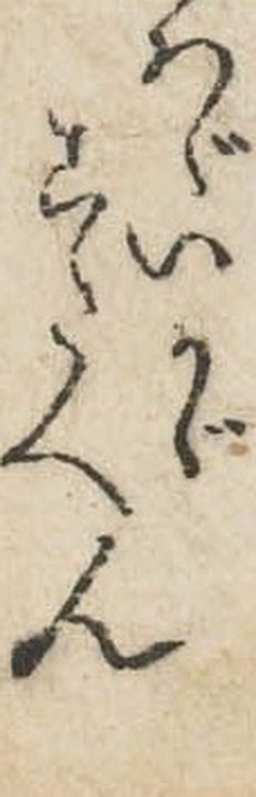こたへん
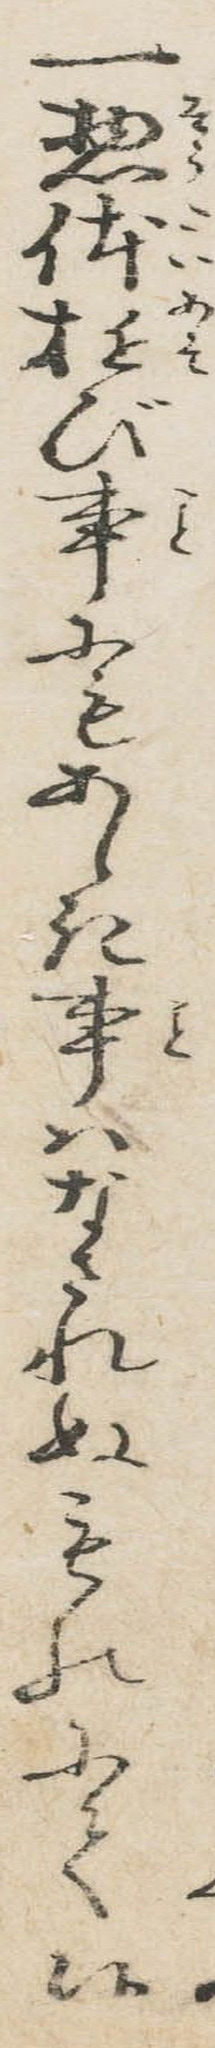一惣体遊び事にもあしき事はなされぬものにて候
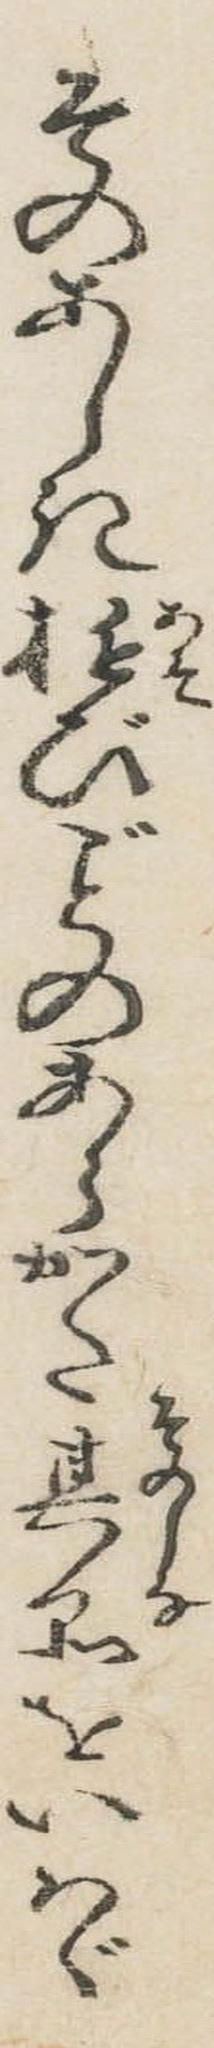そのあしき遊びごとのあらかた其品をいはゞ
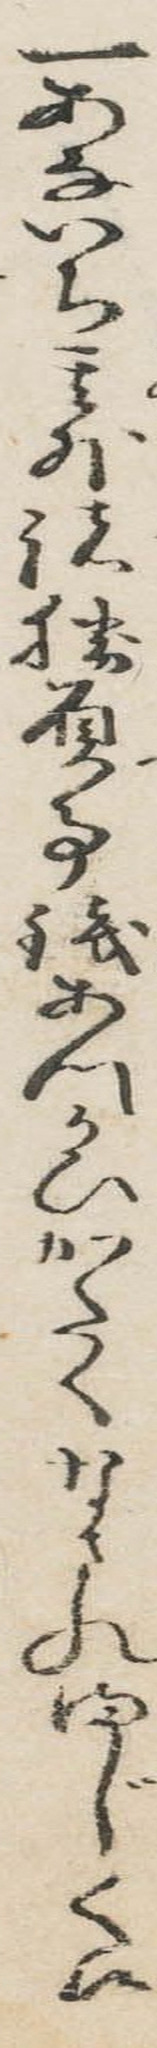一あないち其外諸勝負事銭あつかひかたくなされまじく候
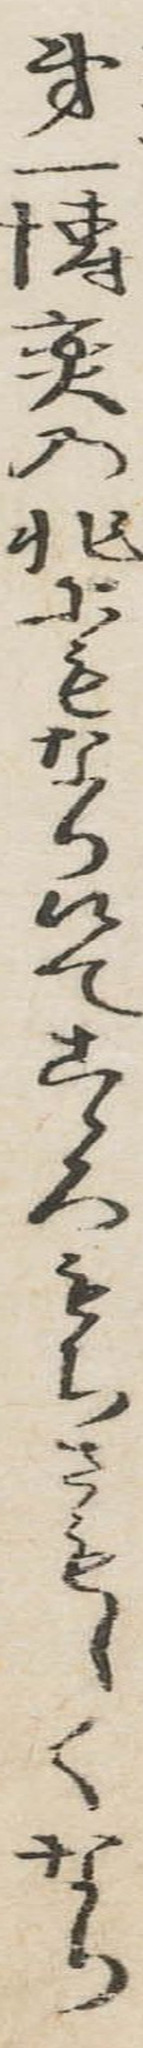第一博奕の兆にもなり候てこゝろもちさもしくなり
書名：前訓
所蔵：東京学芸大学附属図書館
